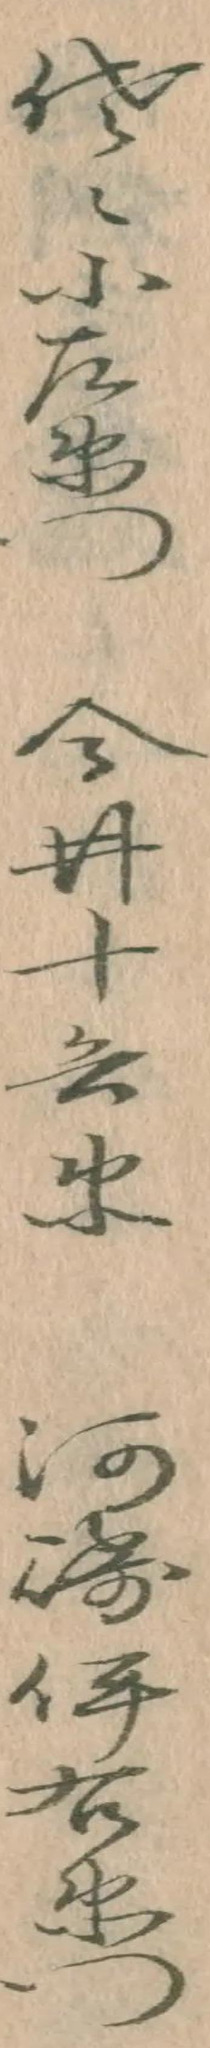佐々小左衛門今井十兵衛河崎伊右衛門
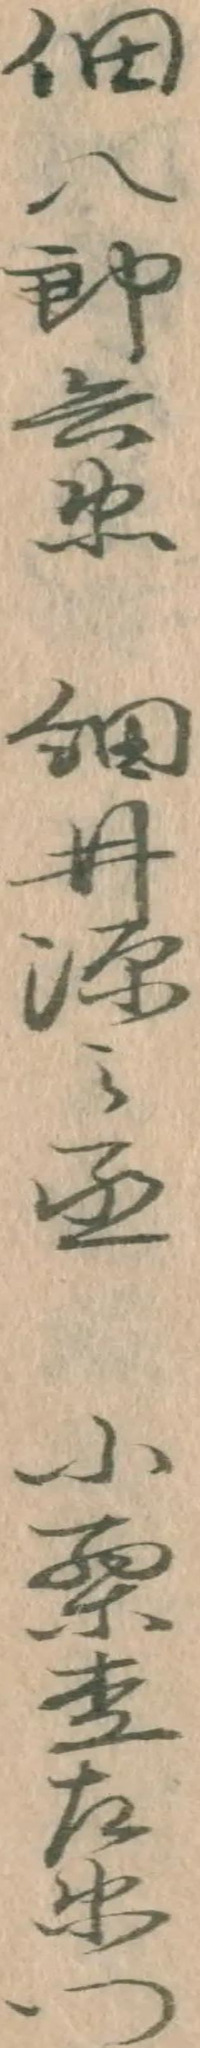佃八郎兵衛細井源之丞小栗杢左衛門
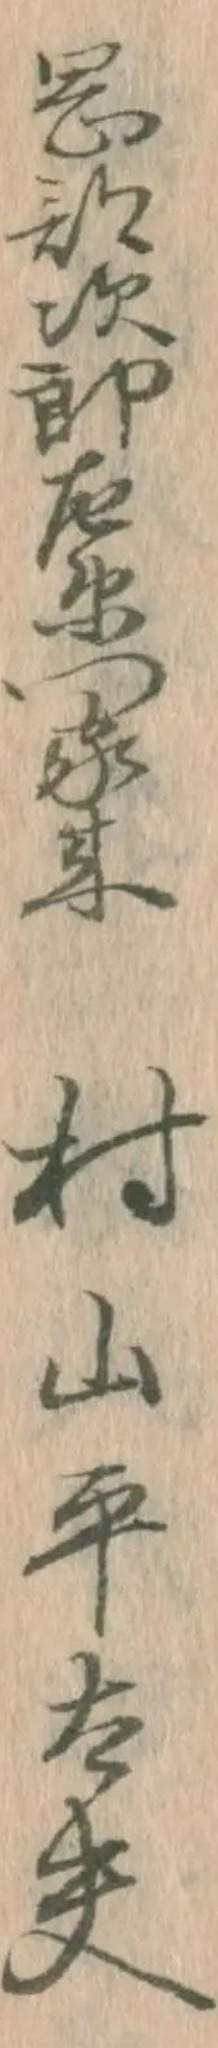岡部次郎左衛門家来村山平太夫
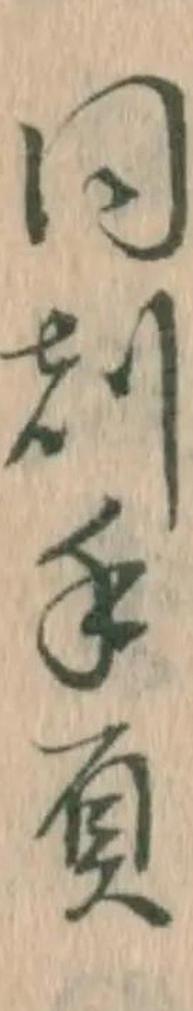同刻手負
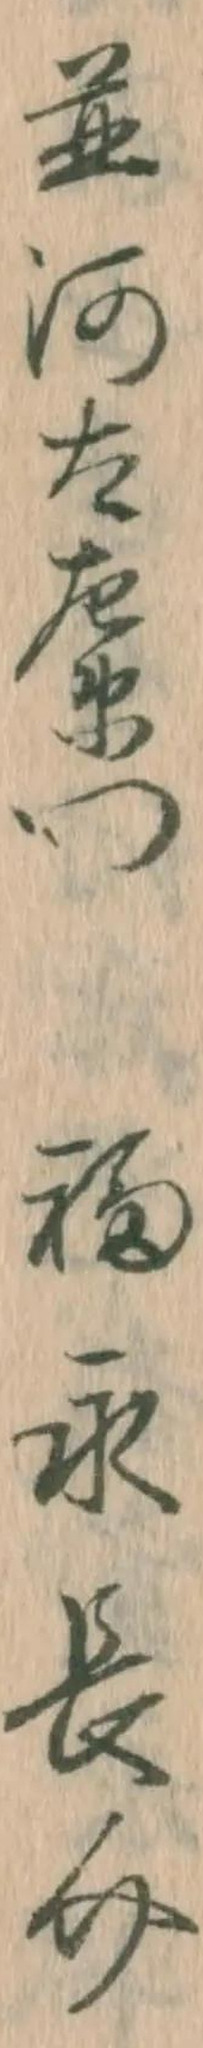並河太左衛門福永長介
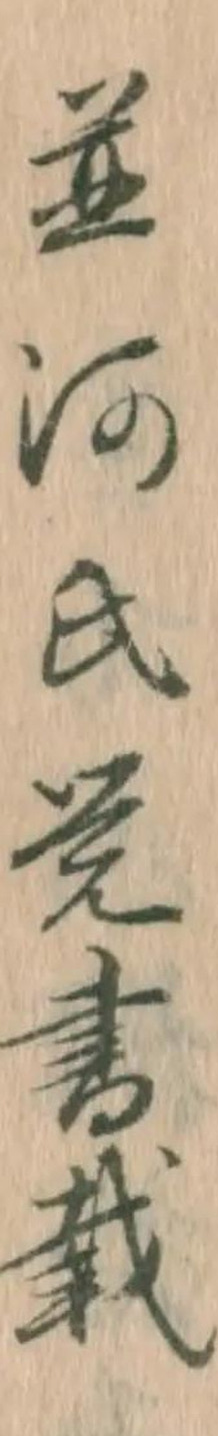並河氏覚書載
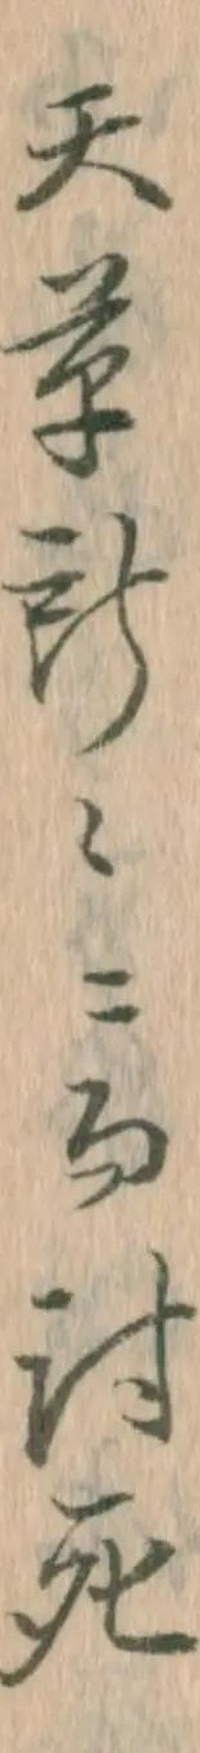天草所々に而討死
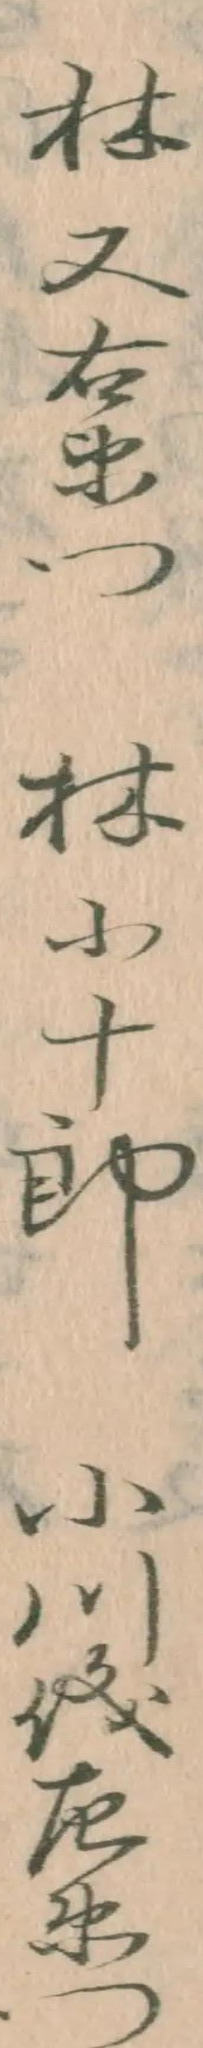林又右衛門林小十郎小川儀左衛門
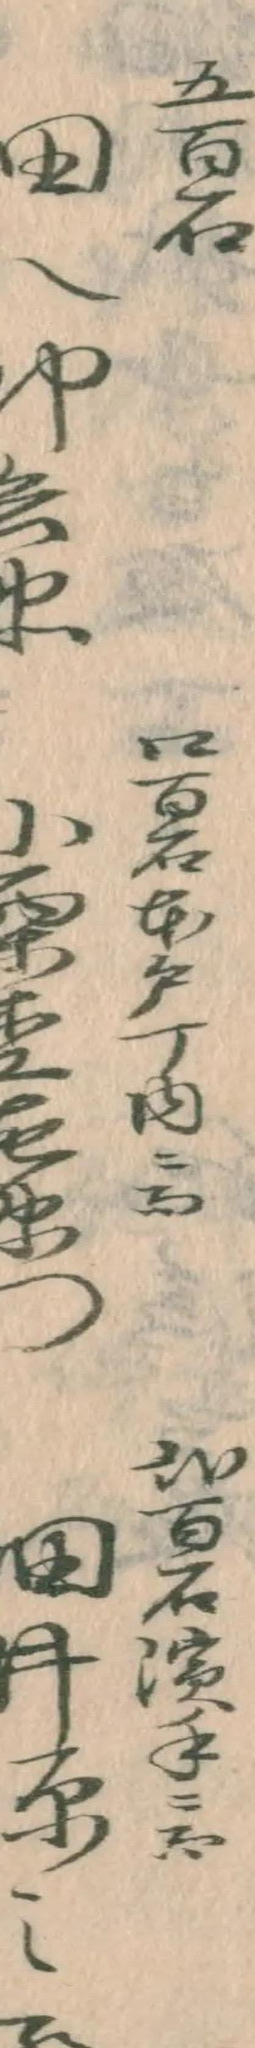佃八郎兵衛小栗杢左衛門細井源之丞
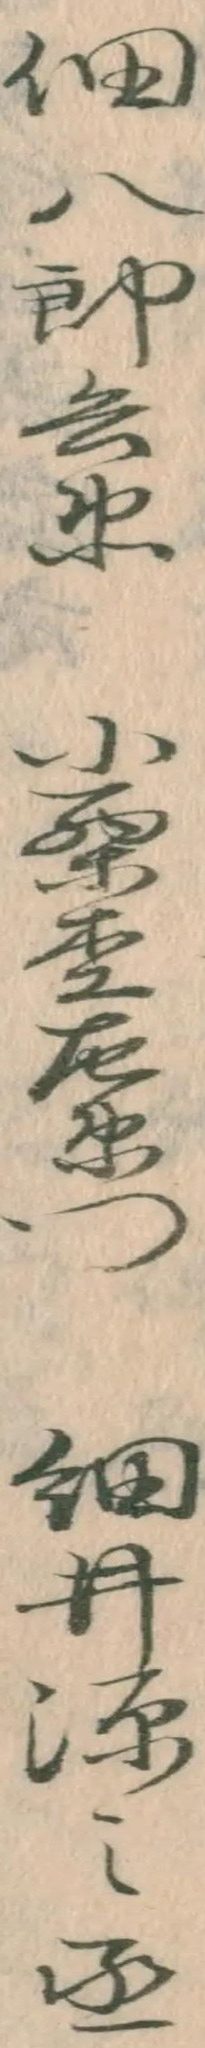佃八郎兵衛小栗杢左衛門細井源之丞
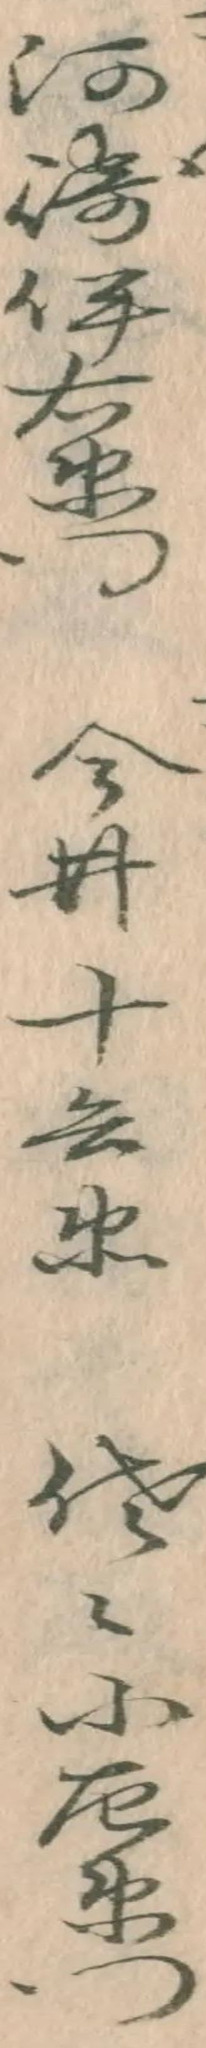河崎伊右衛門今井十兵衛佐々小左衛門
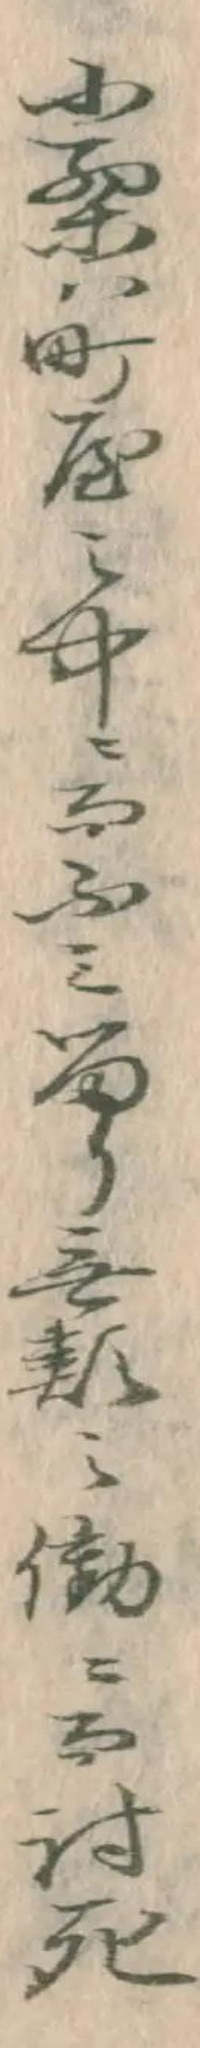小栗は町屋之中に而ふみ留り無類之働に而討死
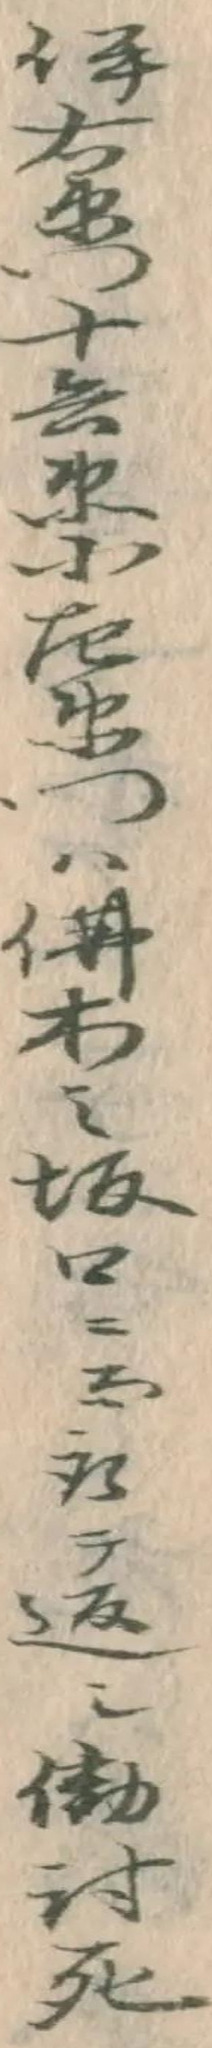伊右衛門十兵衛小左衛門は佛木之坂口に而取て返し働討死
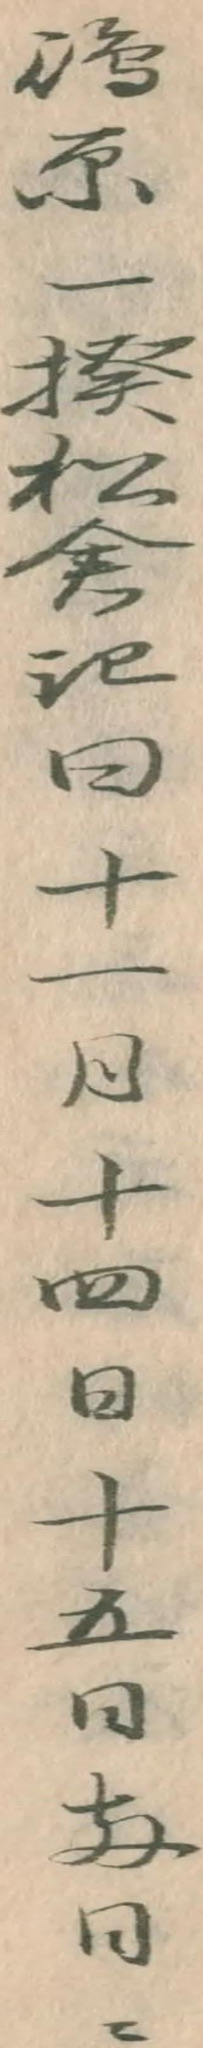嶋原一揆松倉記曰十一月十四日十五日両日に
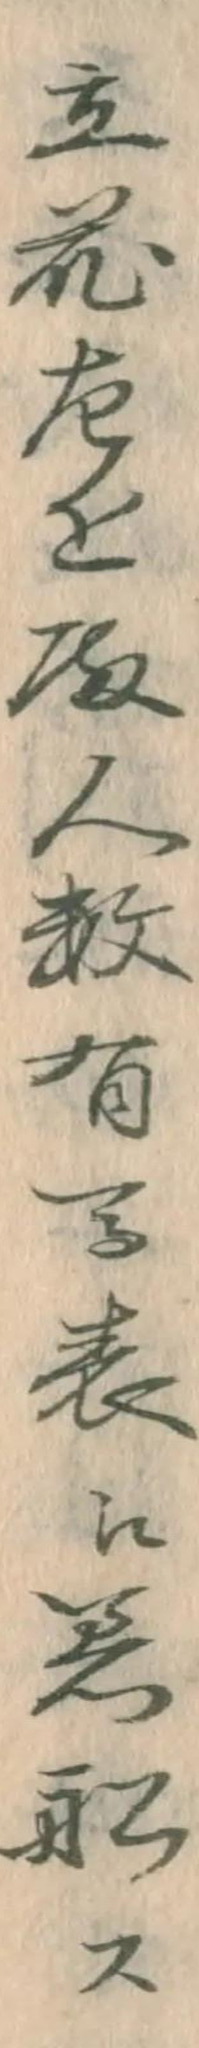立花左近殿人数有馬表江差舩す

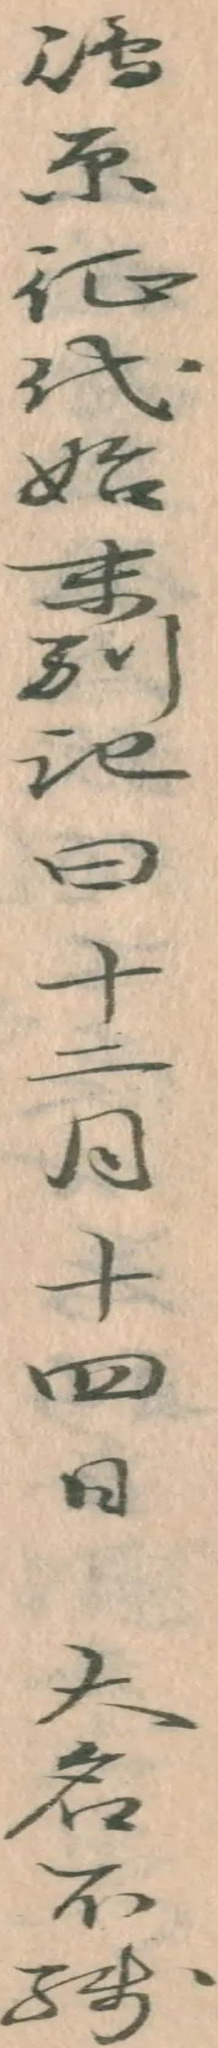島原征伐始末別記曰十二月十四日大名不残
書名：切支丹御退治記 49巻. [2]
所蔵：国立国会図書館 National Diet Library, JAPAN
